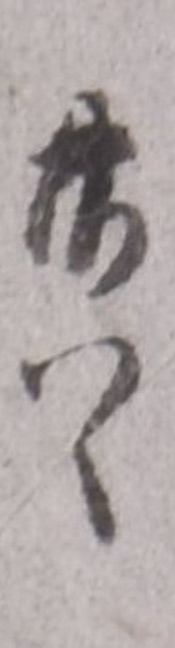廿八日
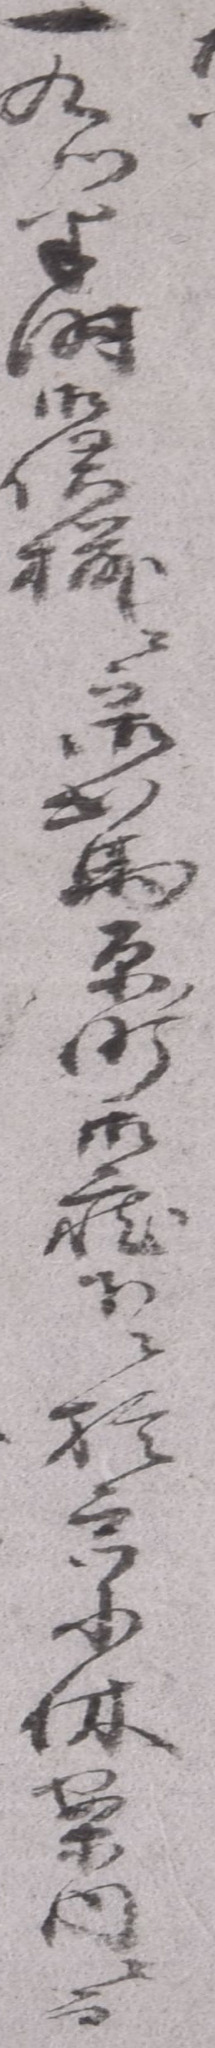一九ツ半時御供揃に而御出馬原ノ町御蔵下に於而御小休案内に而
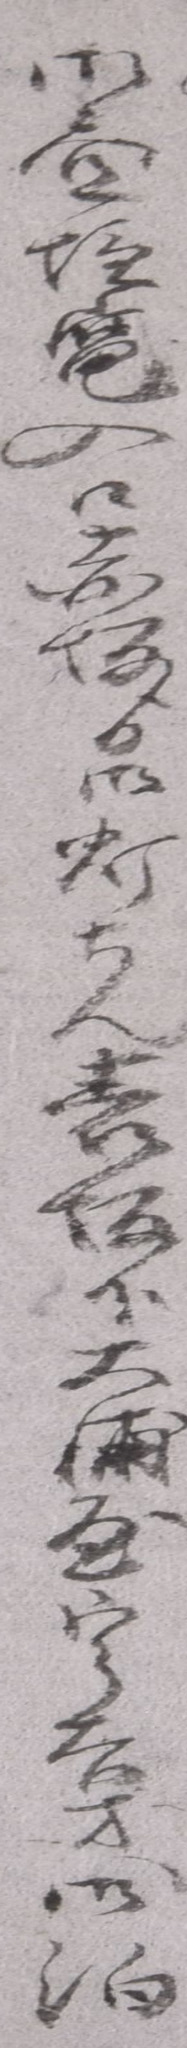御昼塩竃入口赤坂ゟ御灯ちん表坂下大浦屋宇吉方へ御泊
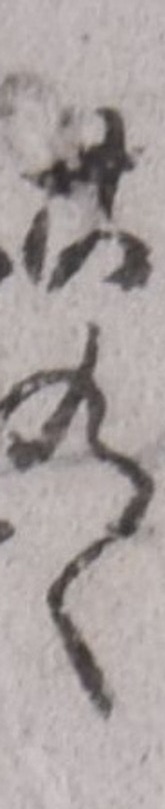廿九日
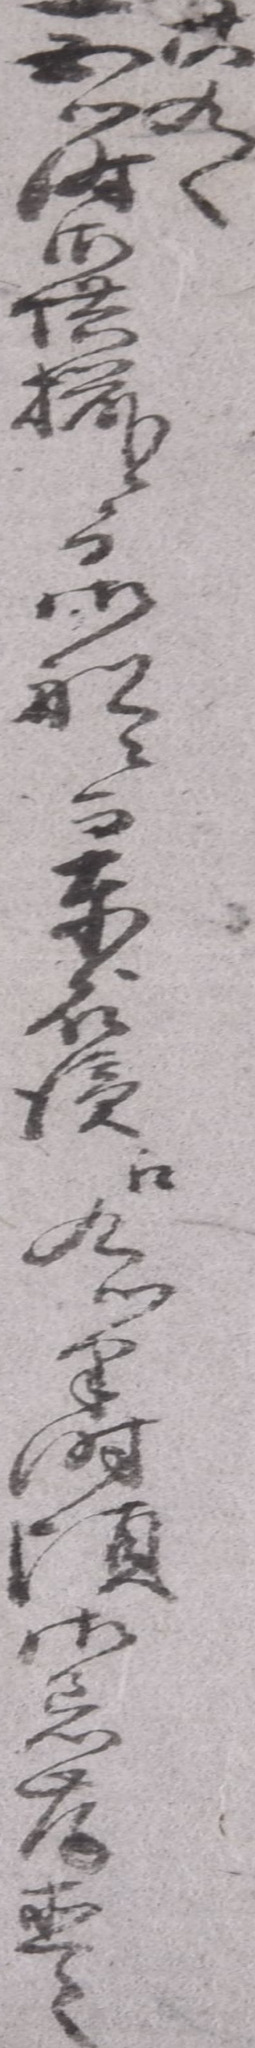一五ツ時御供揃に而御船に而東名浜え九ツ半時頃御着岸直々
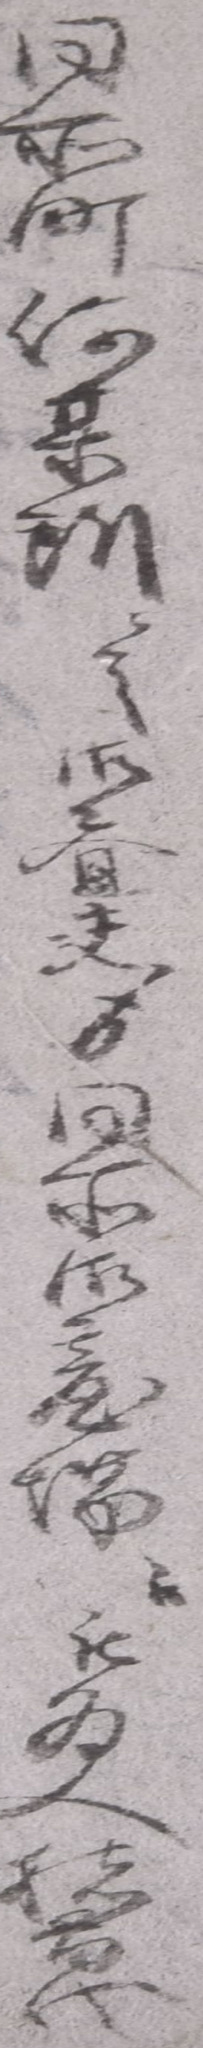同所町何某所にて御昼夫ゟ同所御台場え被為入猪苗代
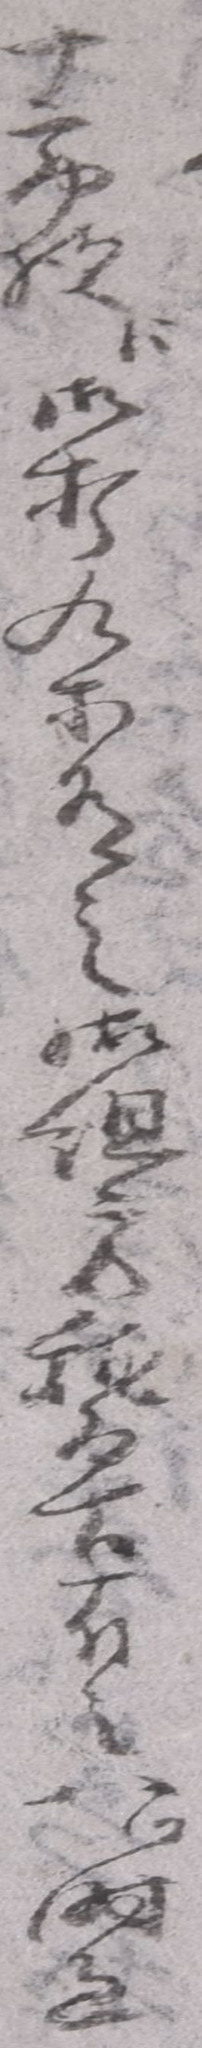十郎様え御打合等有之御組方稽古有之八ツ時過
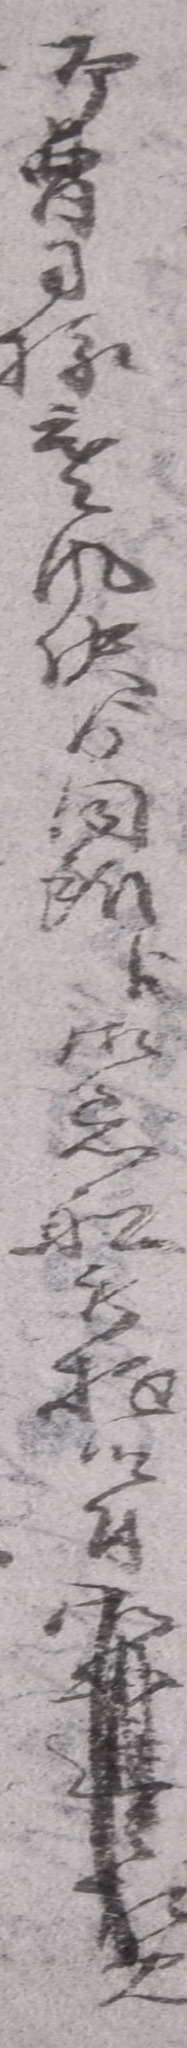御曹司様寒風沢ゟ同所え御着船被遊候付御
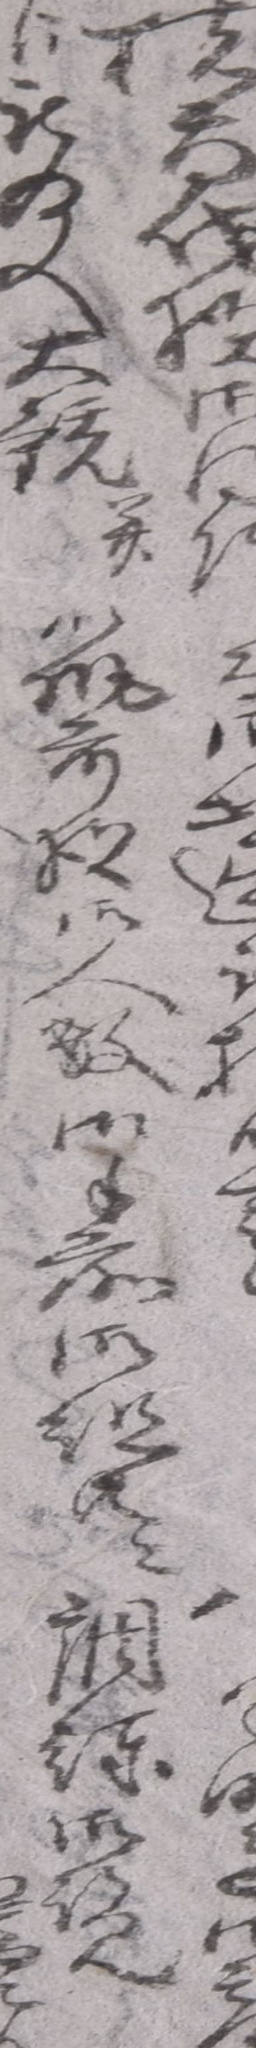え被為入大銃并筑前様御人数御手前御組共に調練御覧暮に及ひ
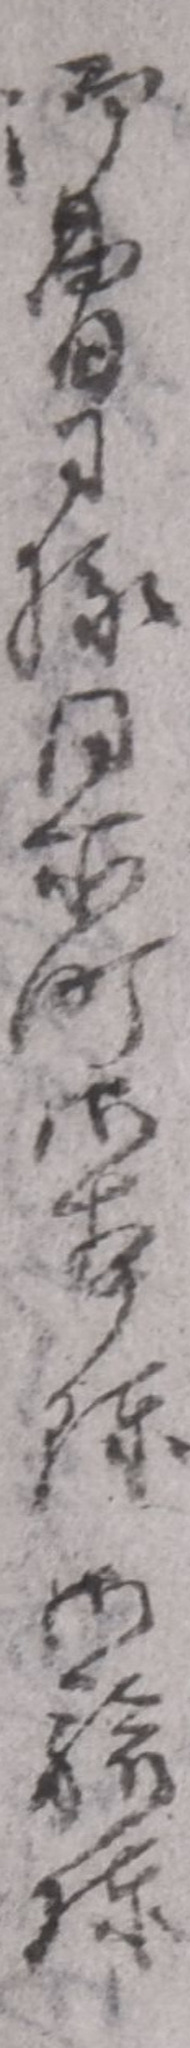御曹司様同所町御本陳御旅陳
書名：富山御陣営日記
